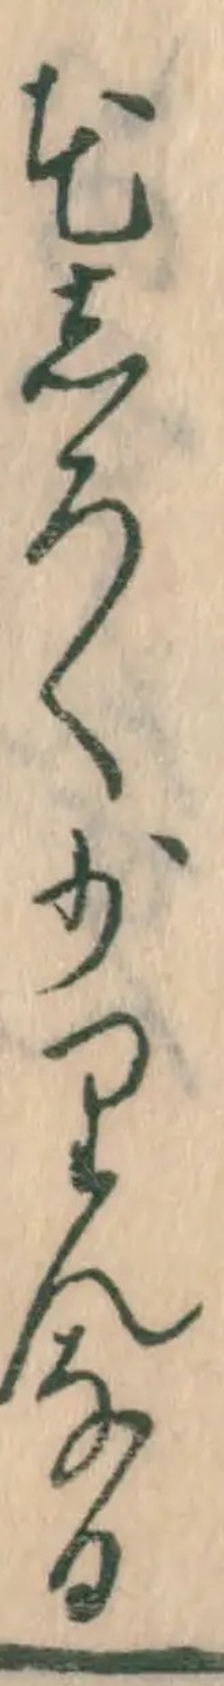花しろく少りんなる
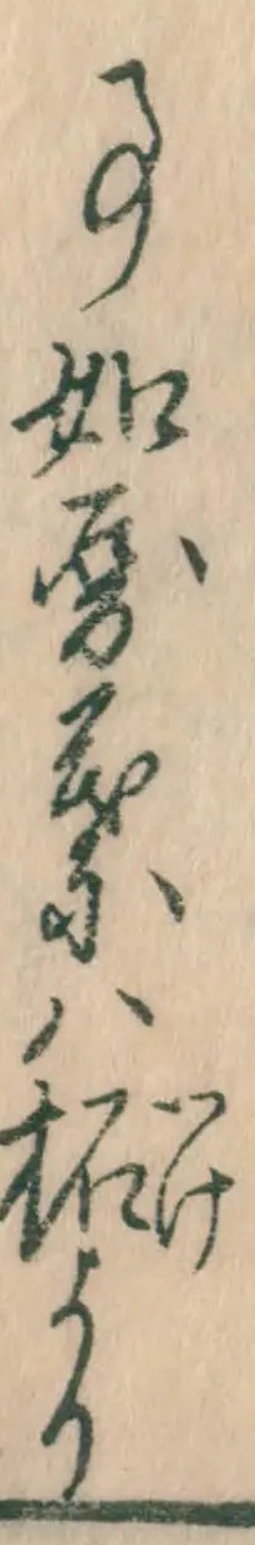事如図葉は柘より
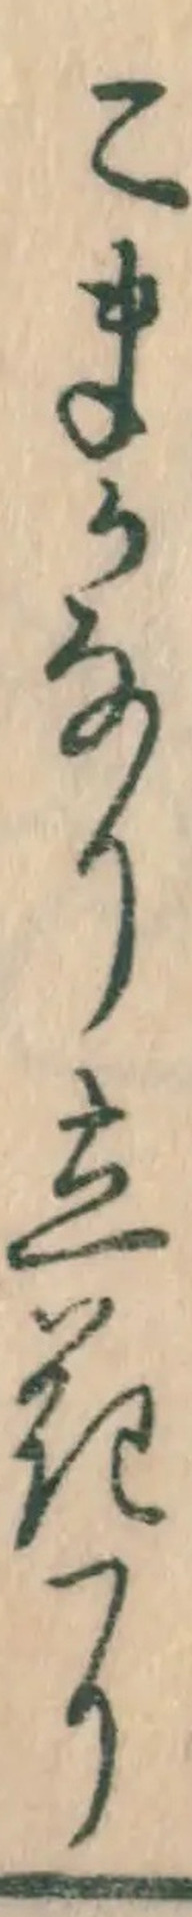こまかなり立花に
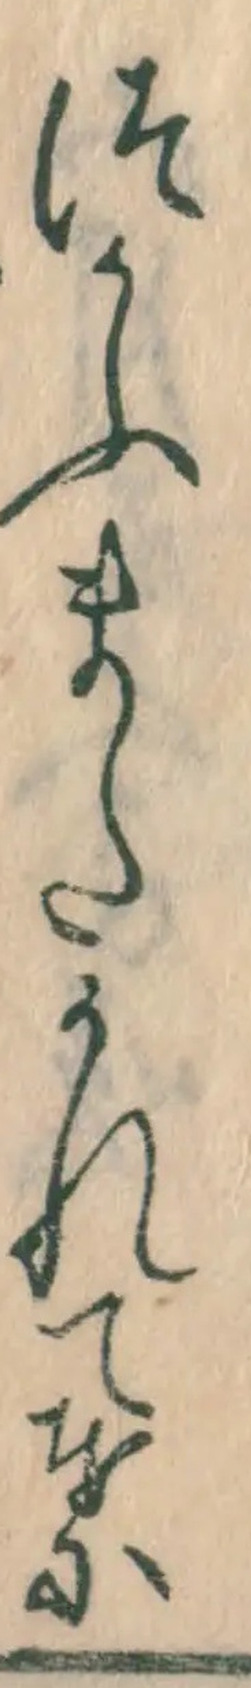つかふまたかれて葉
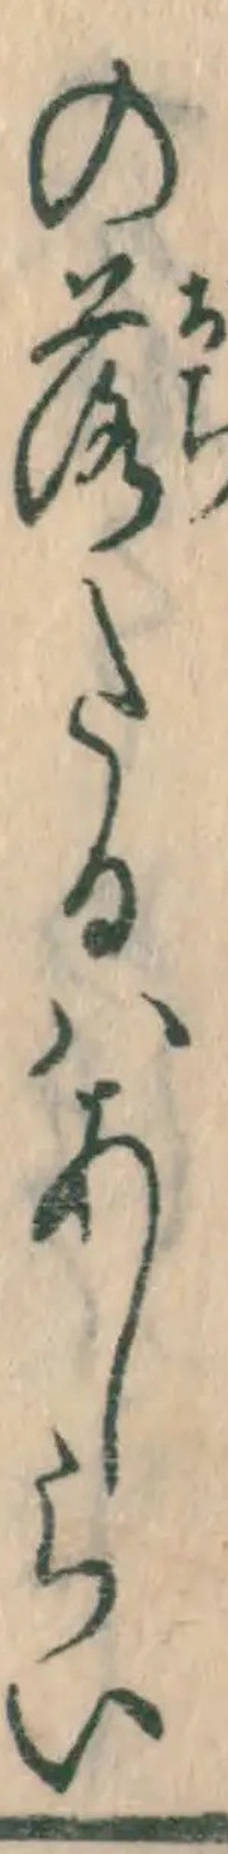の落たるはあしらい
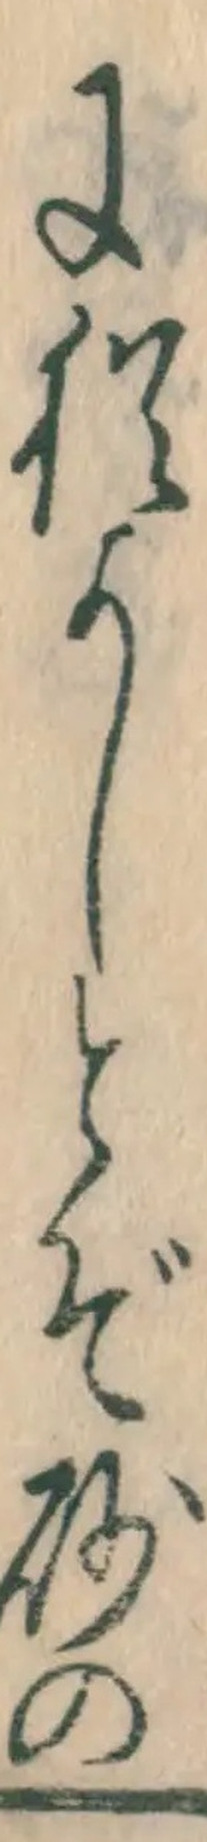に程よしとぞ砂の

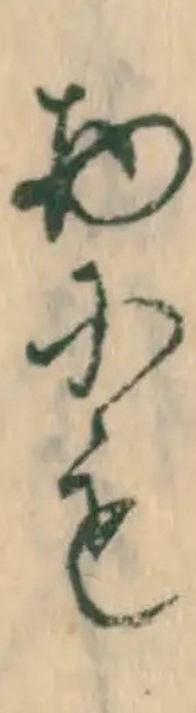物にも
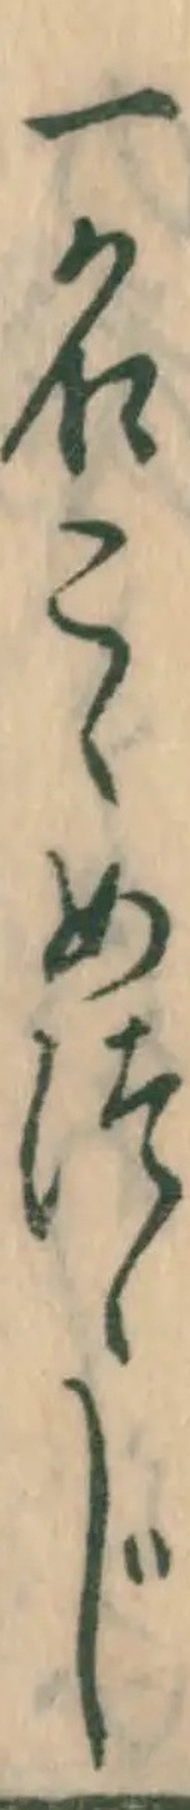一名こゝめつゝじ
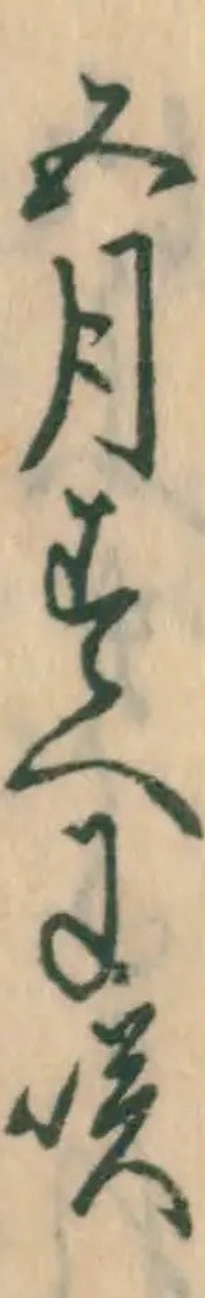五月すへに咲
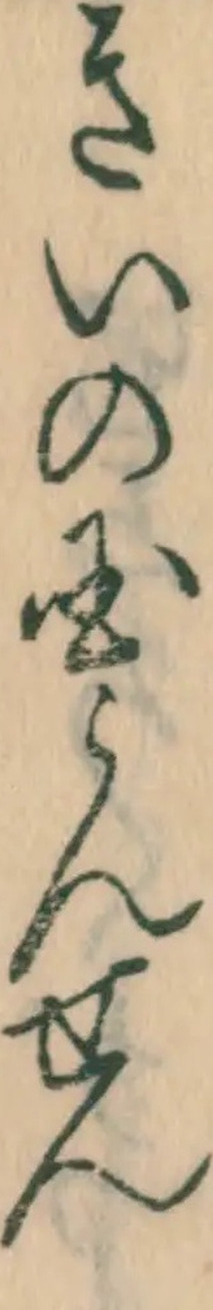きいの国うんせん
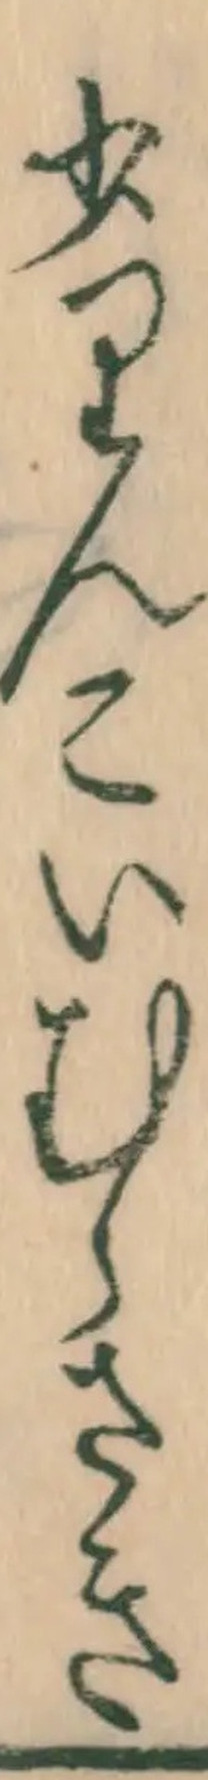少りんこいむらさき
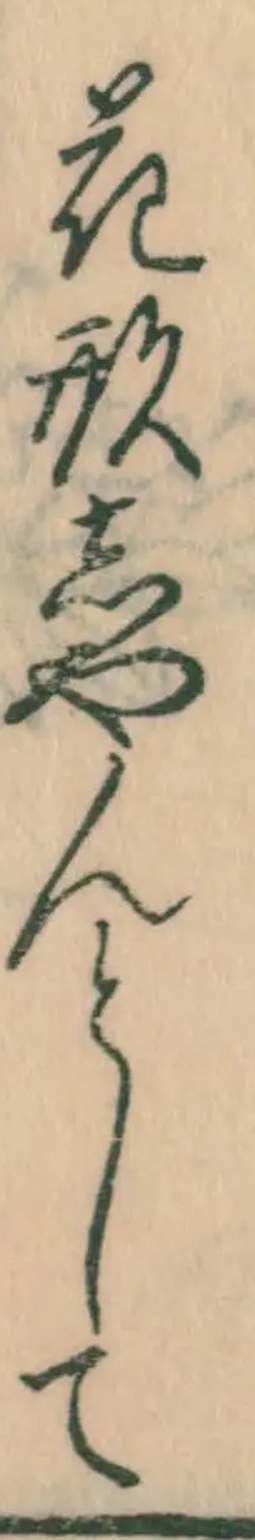花形しやんとして
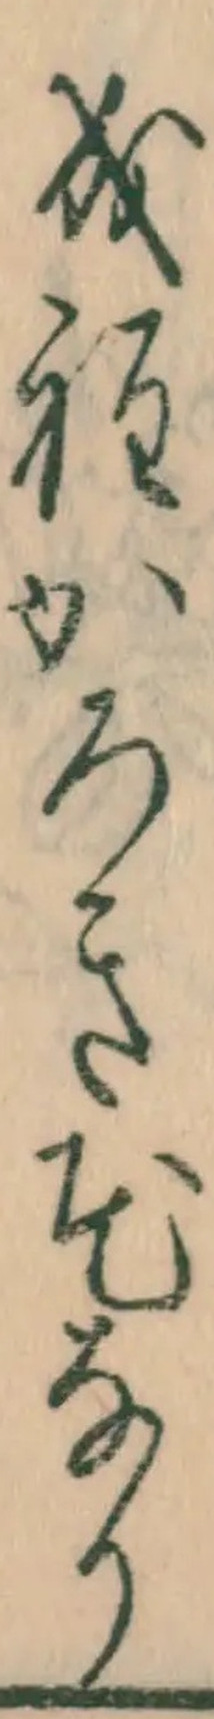成程かろき花なり
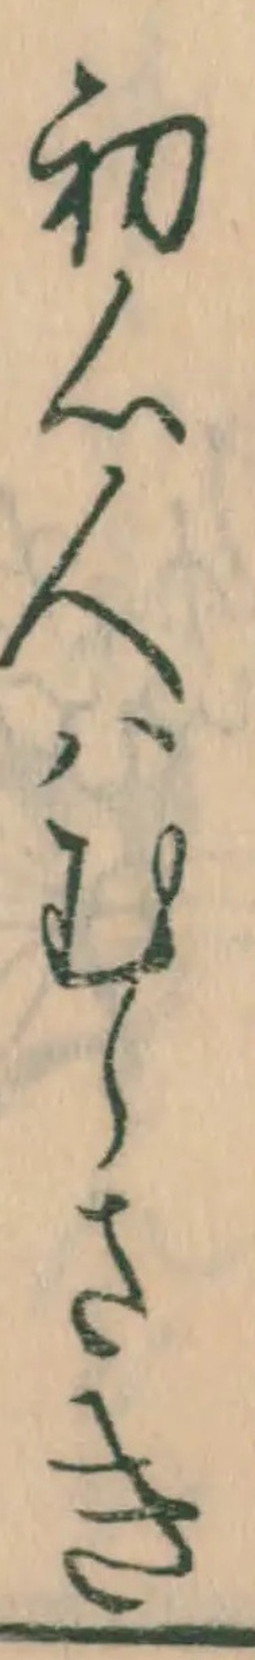初心人はむらさき
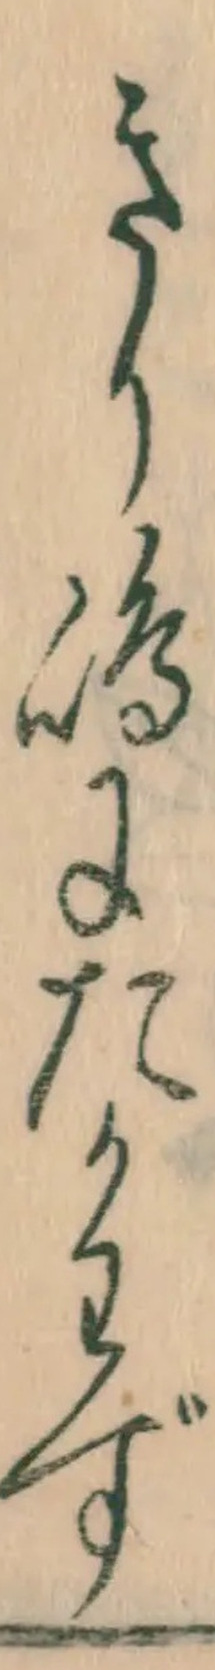きり嶋にたかわず
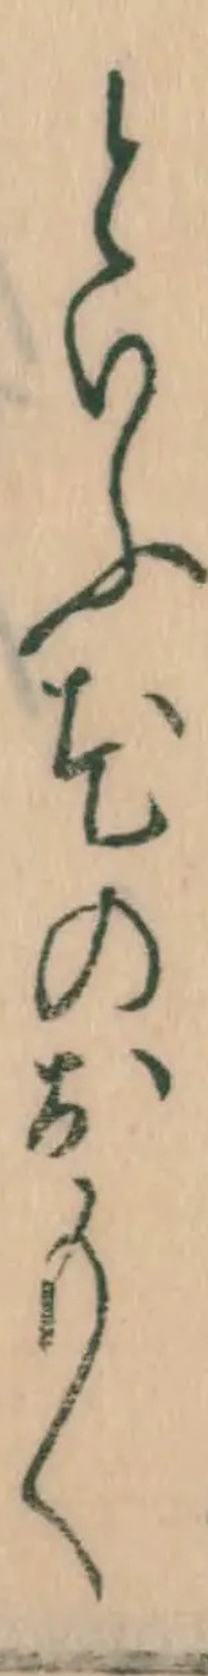といふ花のおもく
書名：錦繍枕 5巻. [2]
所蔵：国立国会図書館 National Diet Library, JAPAN
